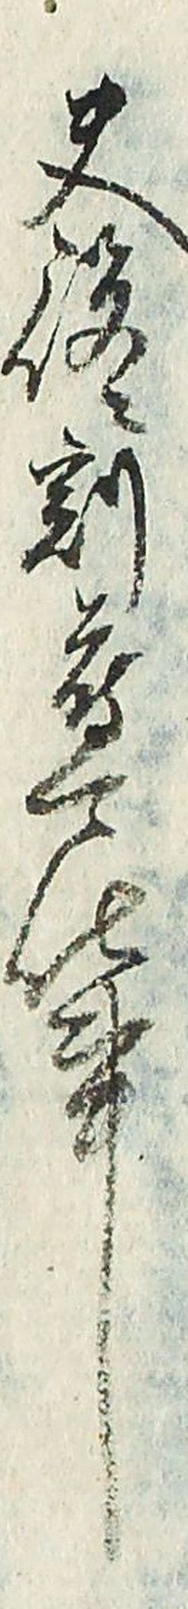夫役に割符可仕事
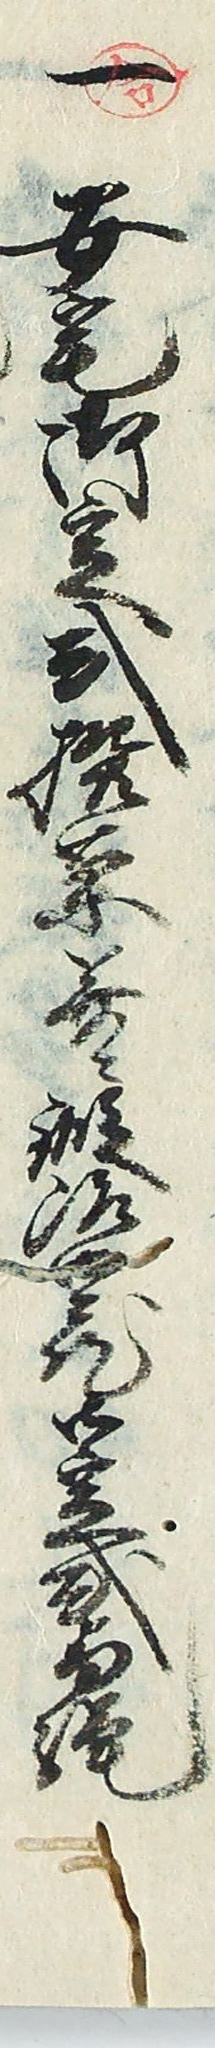一安宅御定弐撰茶幷に鍛冶御蔵御定弐番縄
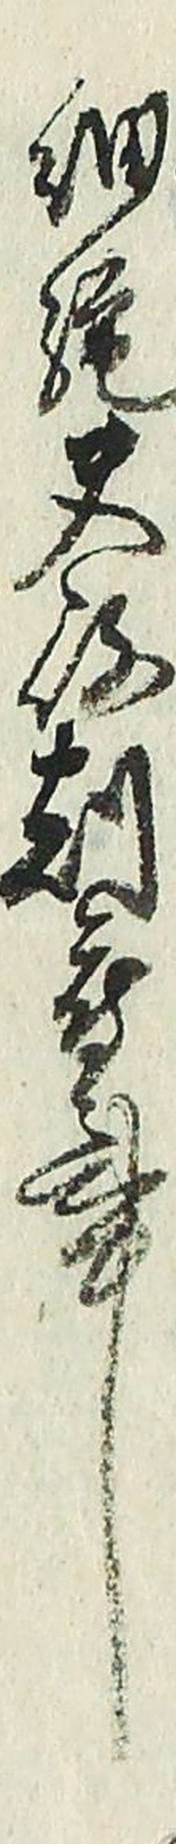細縄夫役割符の事
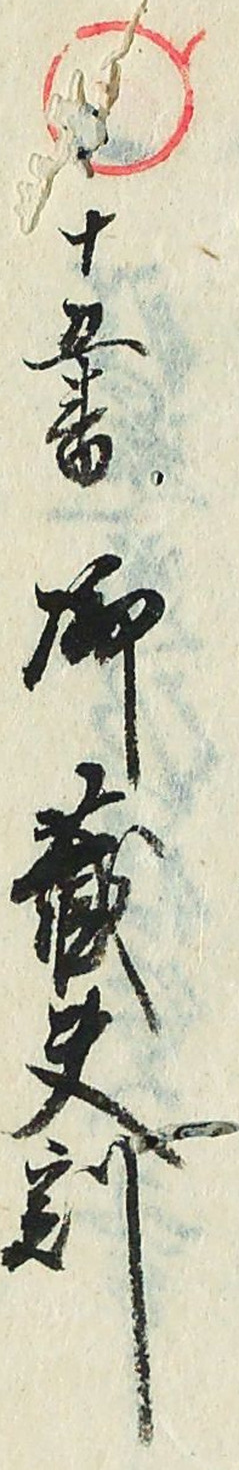十五番御蔵夫割
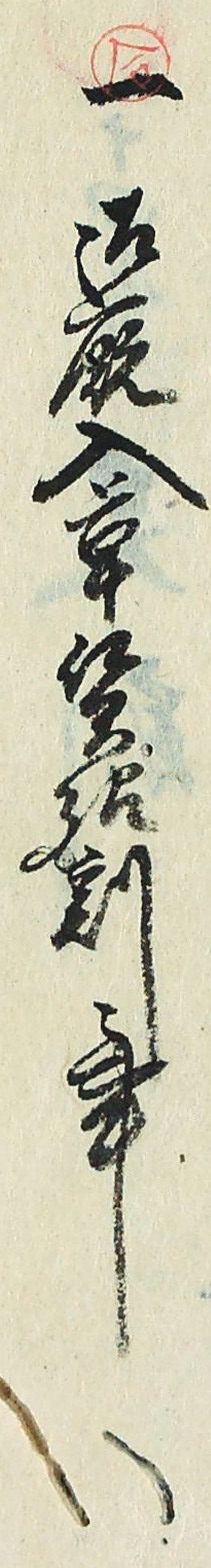一御厩入草賃銀割の事
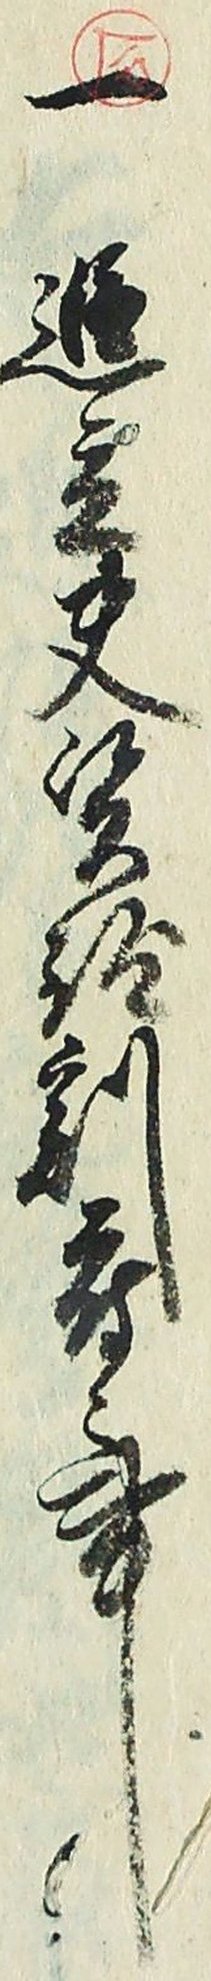一追立夫賃銀割符の事

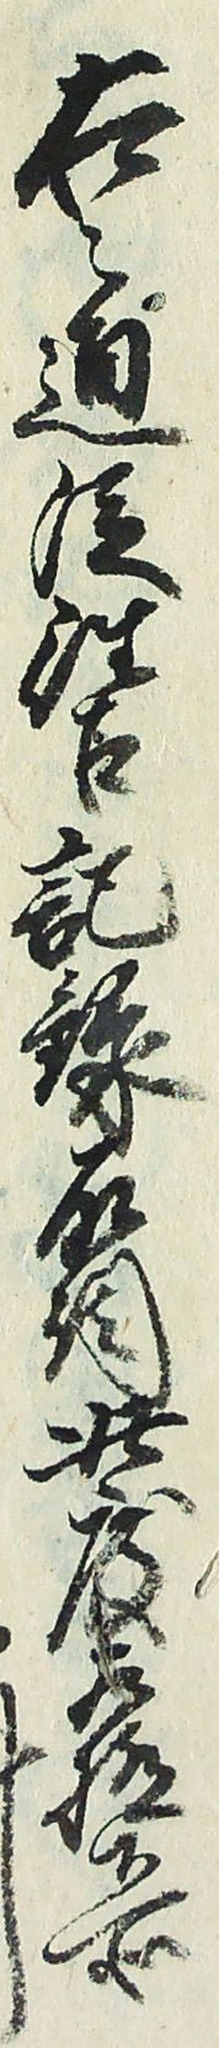右之通従往古記録取調此度相極候所
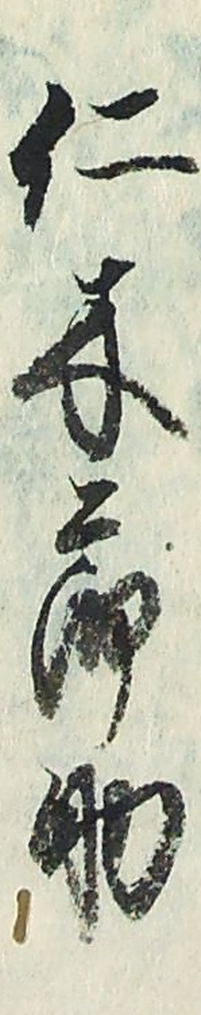仁木節助
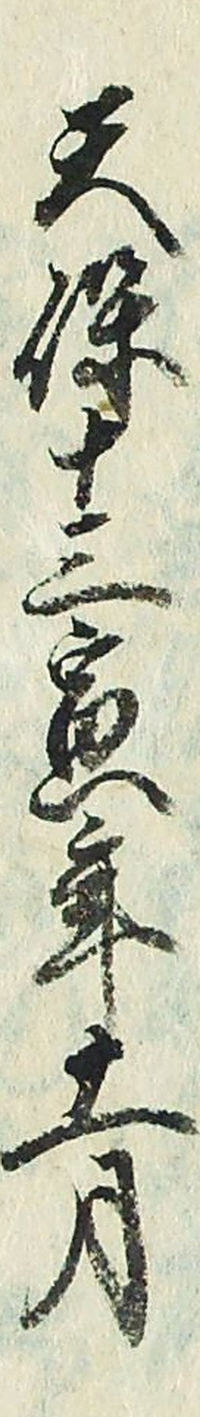天保十三寅年十一月
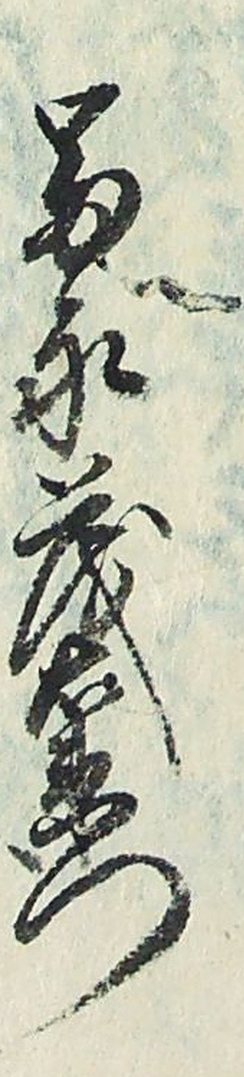富永茂右衛門
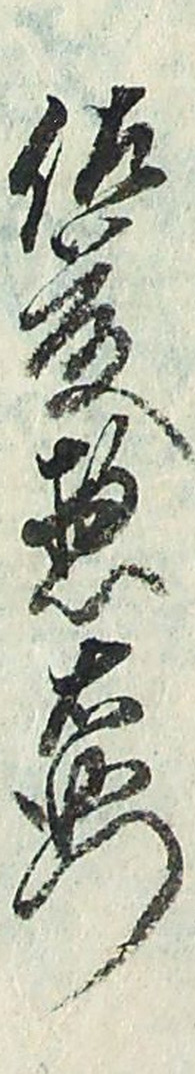佐藤惣右衛門
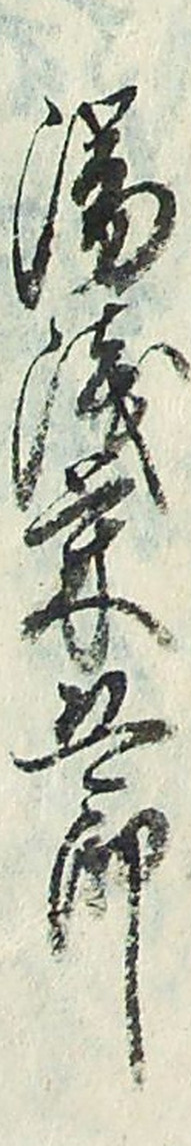湯浅栄五郎

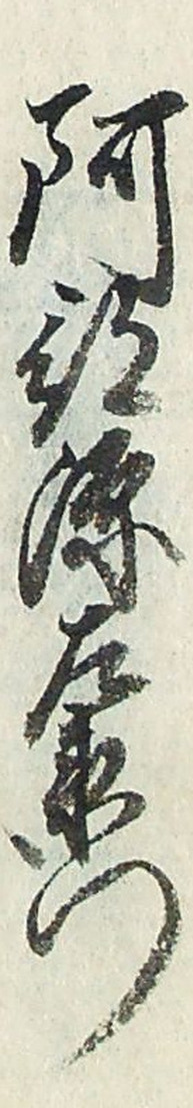阿部源左衛門
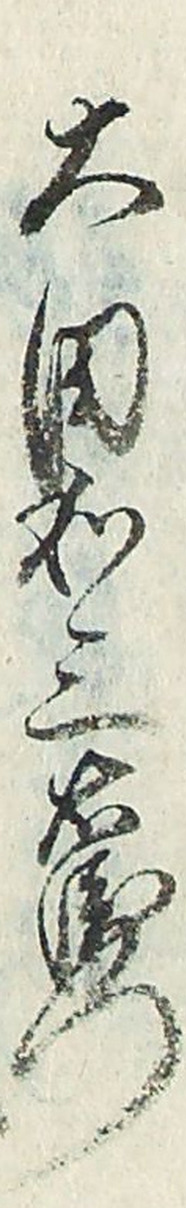大田和三右衛門
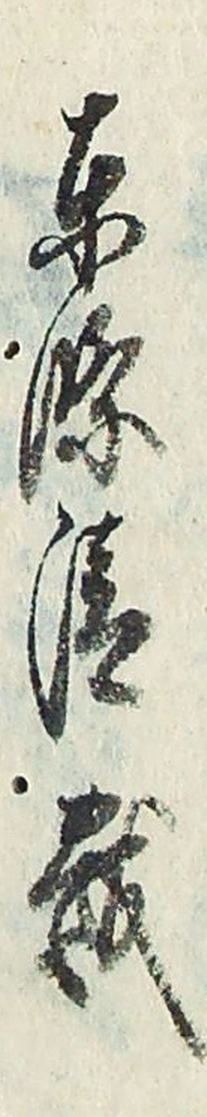東條清蔵
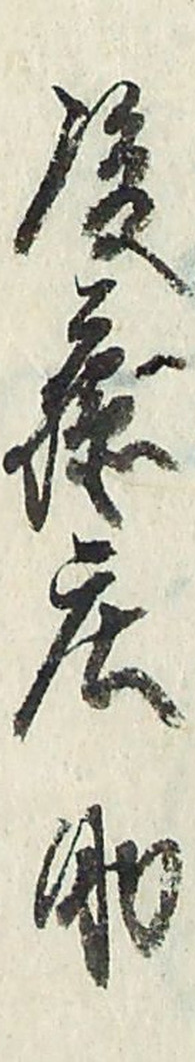後藤庄助
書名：諸割賦物賃銀定記録帳
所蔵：鳴門教育大学 Naruto University of Education
